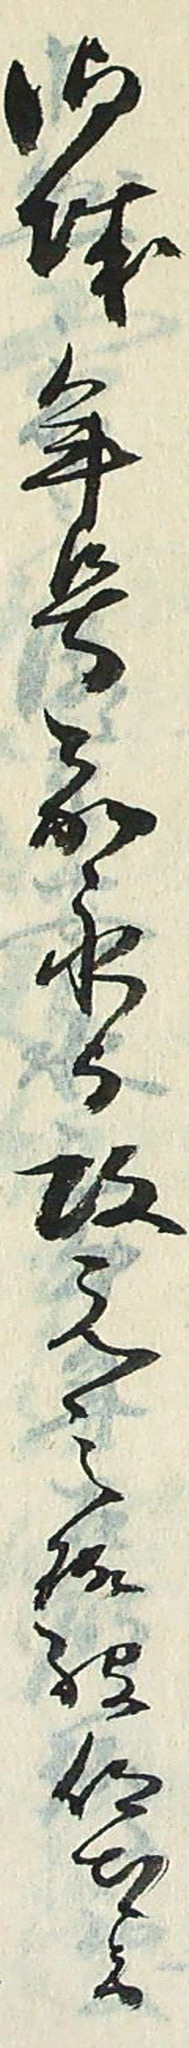御城年号嘉永と改元之趣被仰出候旨
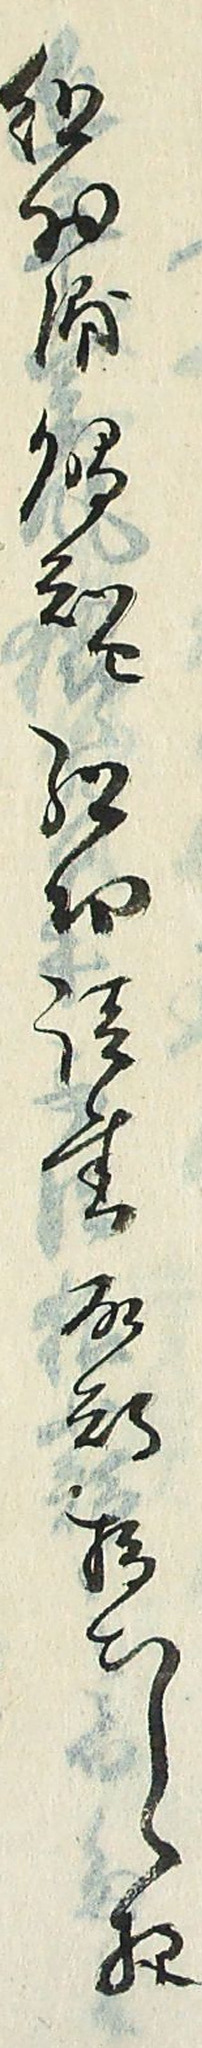組村浦触知せ組切請書取都指出候様
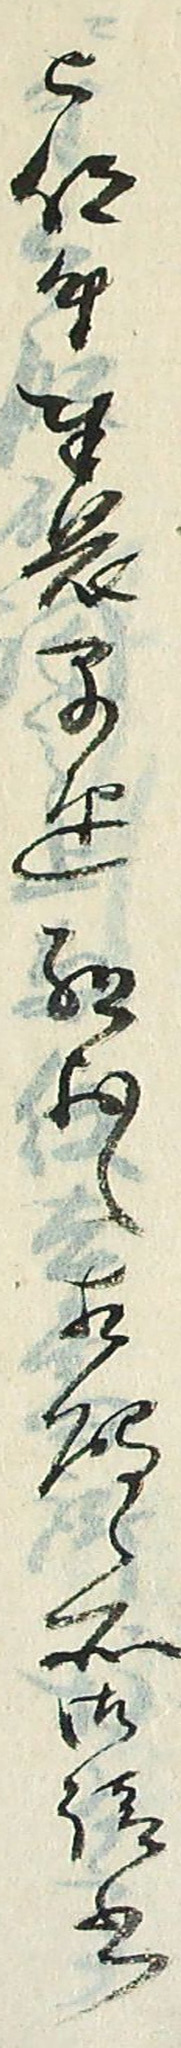被仰付奉畏早速組村へ相触候所御請書

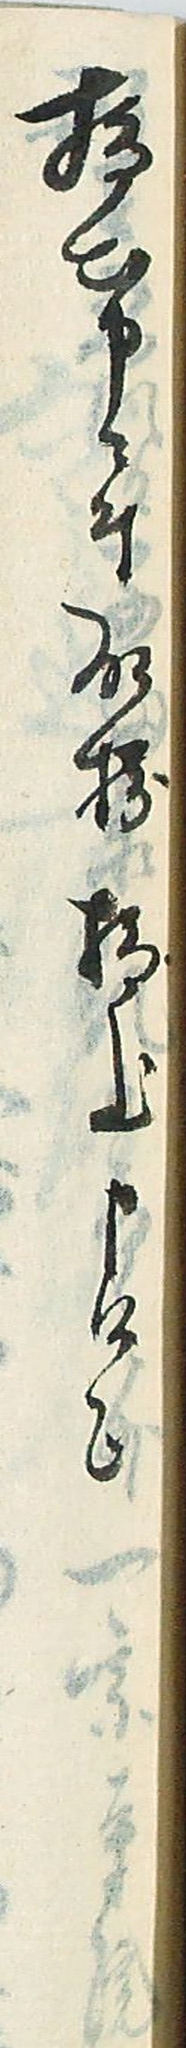指上申に付取揃指上申候以上
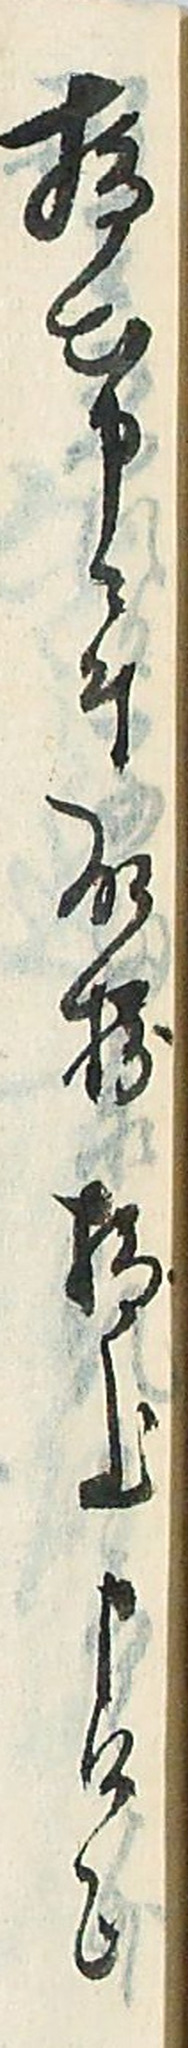指上申に付取揃指上申候以上
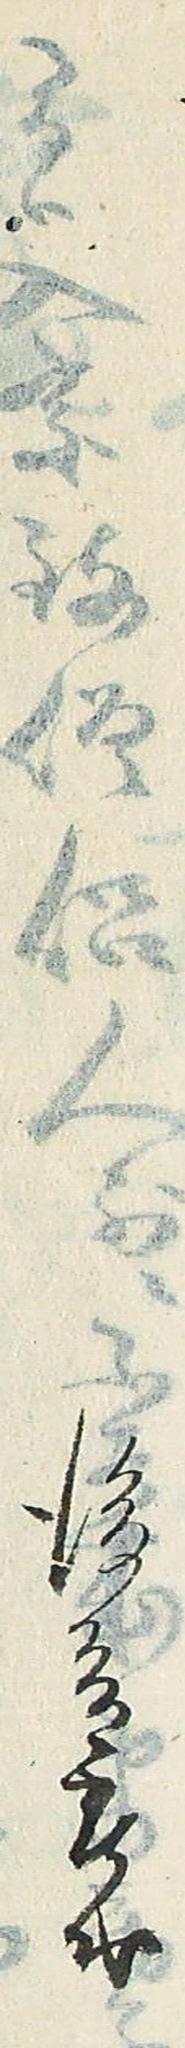後藤庄助
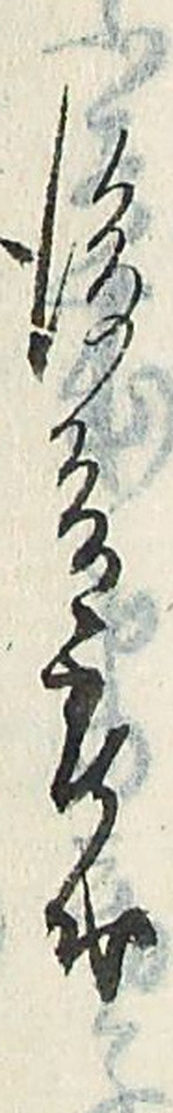後藤庄助
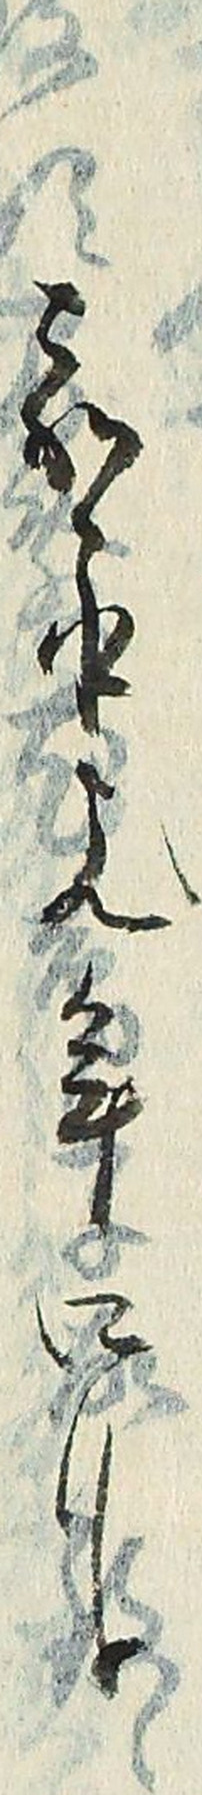嘉永元年四月
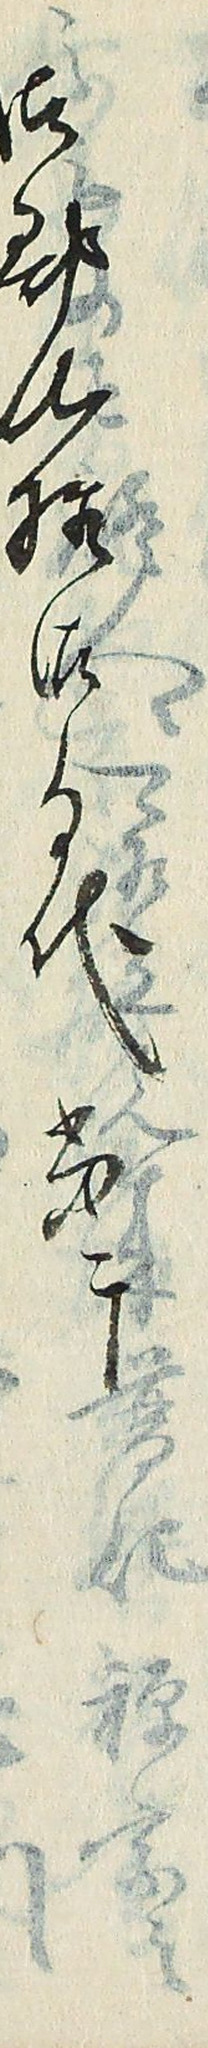御郡代様御手代当て
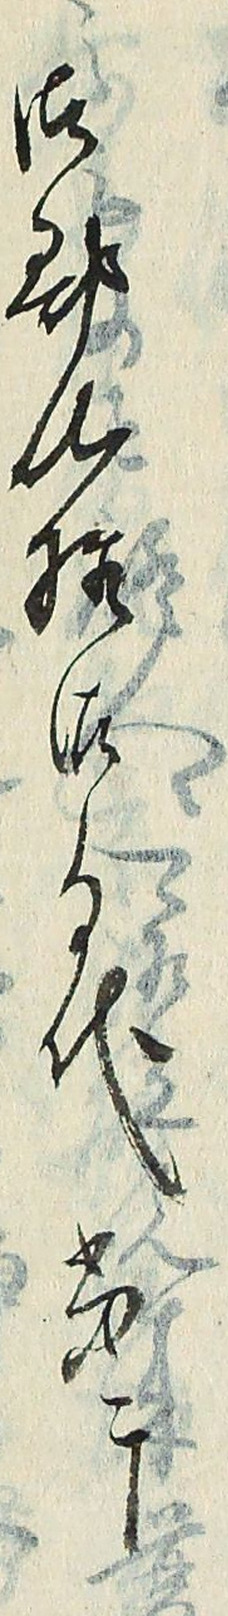御郡代様御手代当て
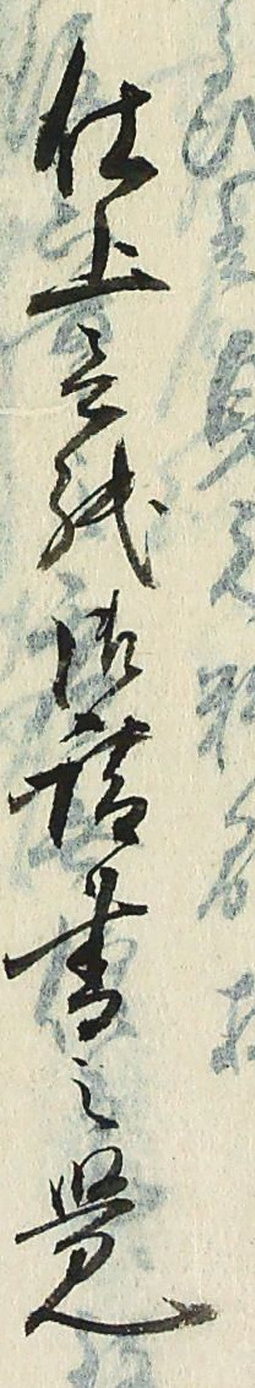仕上壱紙御請書之覚
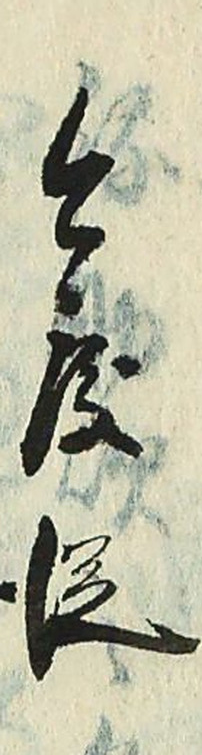今度従
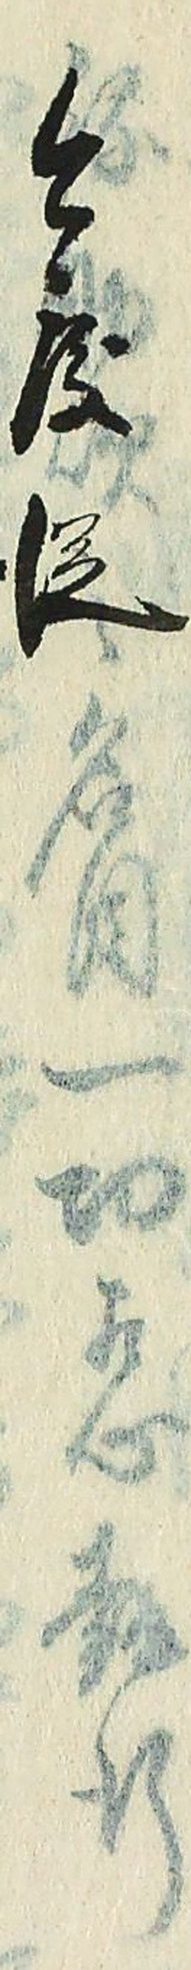今度従
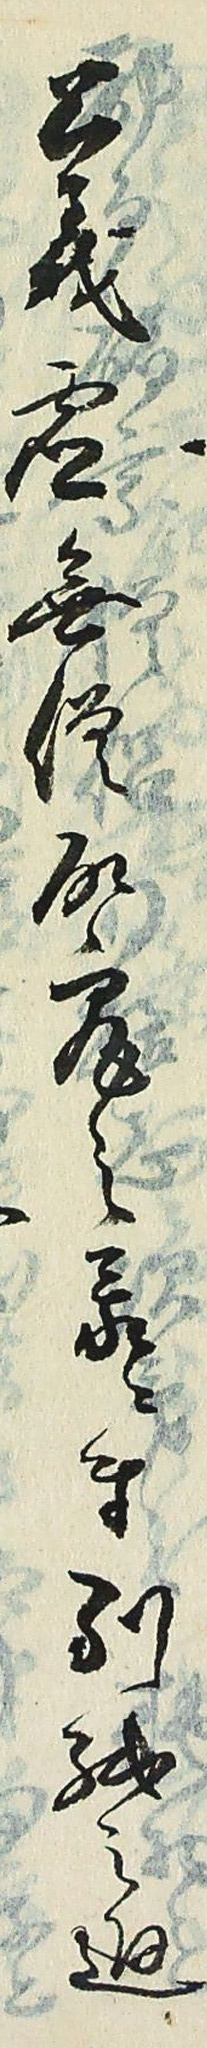公義虚無僧取究之義に付き別紙之通
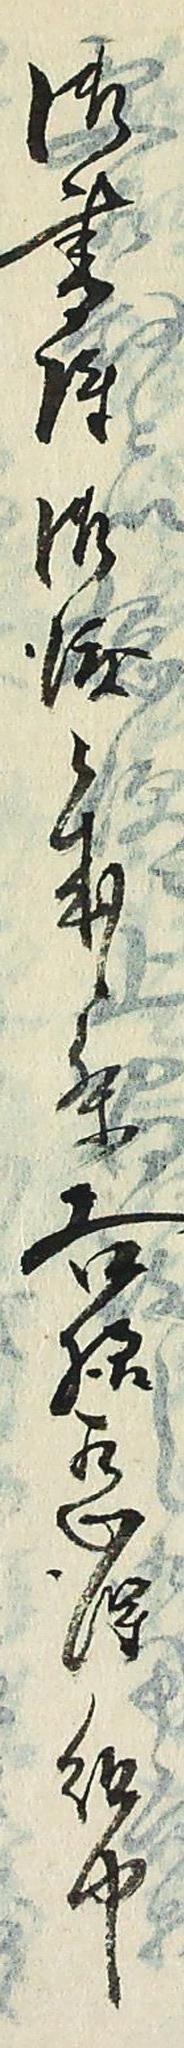御書附御渡被成候条右様相心得組中
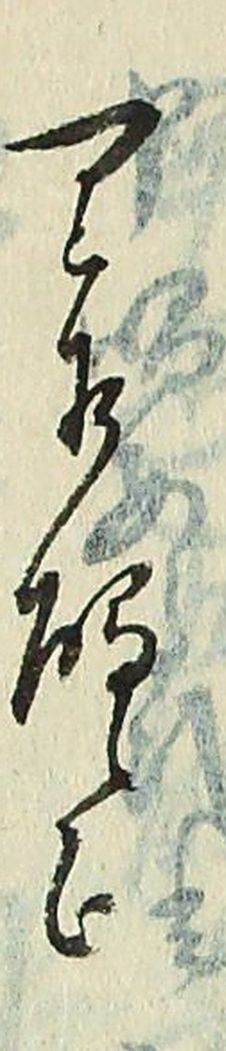可被相触候以上
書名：諸御用御□受書控
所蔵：鳴門教育大学 Naruto University of Education
